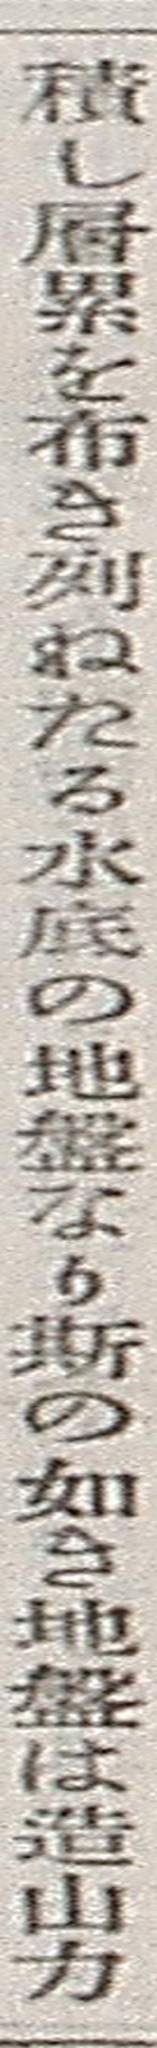積し層累を布き列ねたる水底の地盤なり斯の如き地盤は造山力
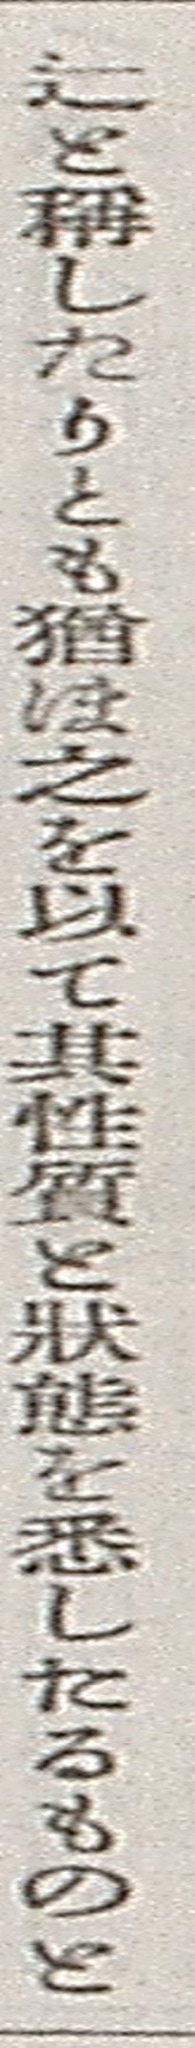辷と称したりとも猶ほ之を以て其性質と状態を悉したるものと
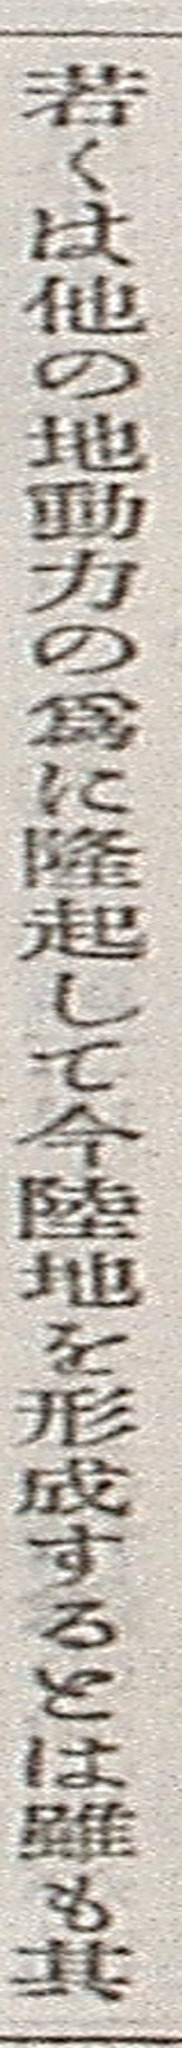若くは他の地動力の為に隆起して今陸地を形成するとは雖も其
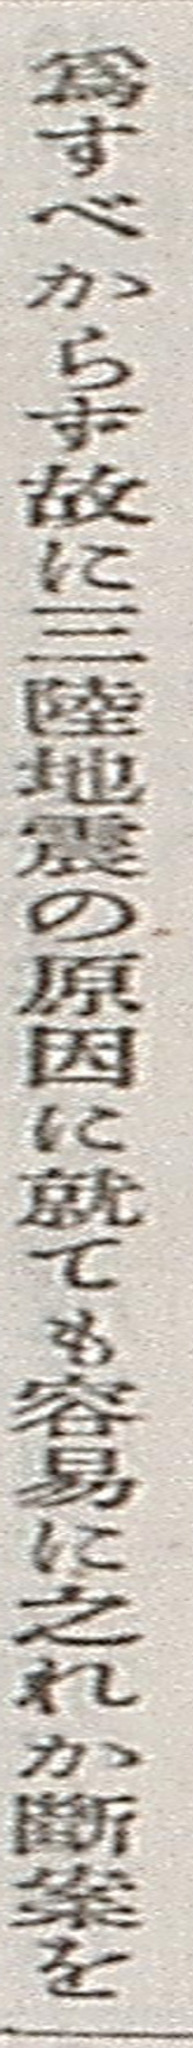為すべからず故に三陸地震の原因に就ても容易に之れか断案を
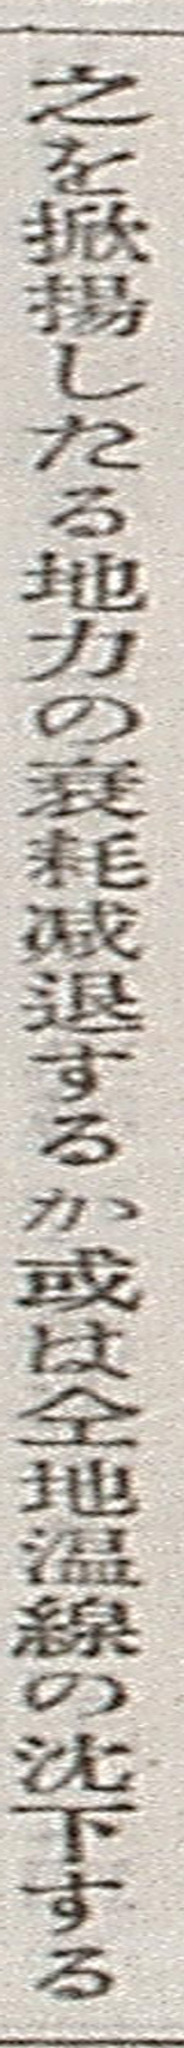之を掀揚したる地力の衰耗減退するか或は同地温線の沈下する
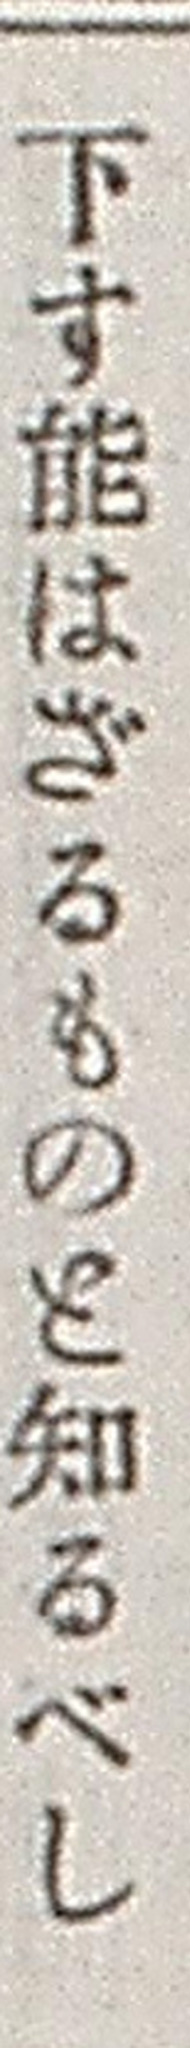下す能はざるものと知るべし
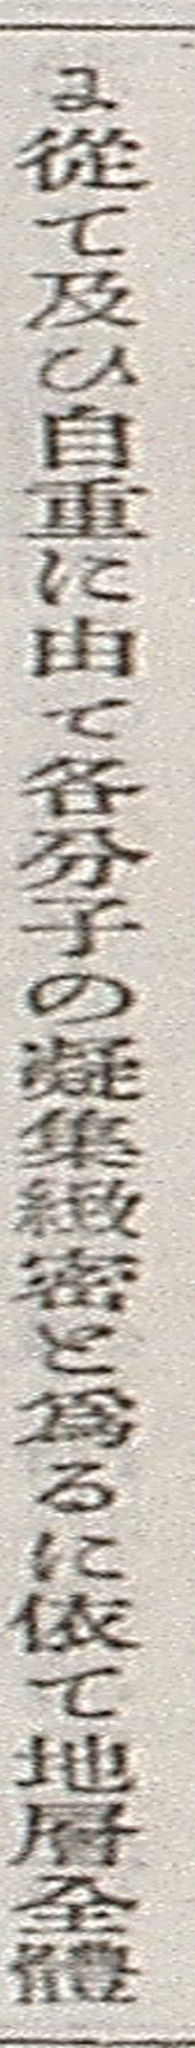に従て及ひ自重に由て各分子の凝集緻密と為るに依て地層全体
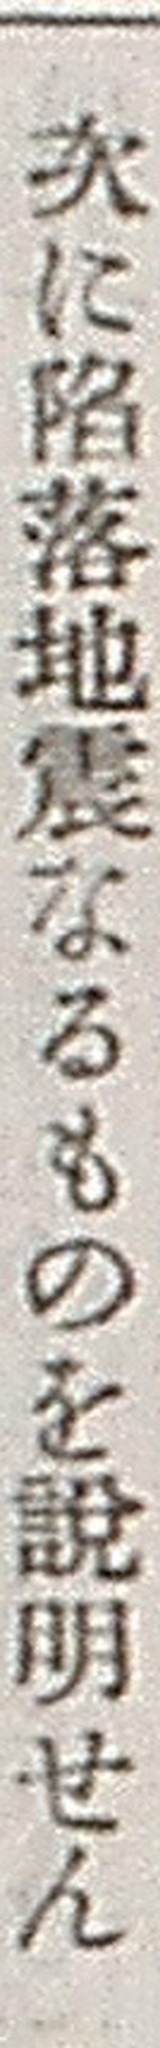次に陥落地震なるものを説明せん
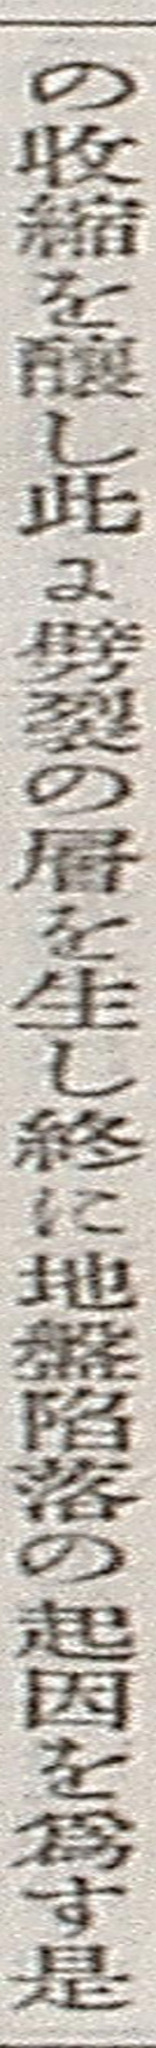の収縮を醸し此に劈裂の層を生し終に地盤陥落の起因を為す是
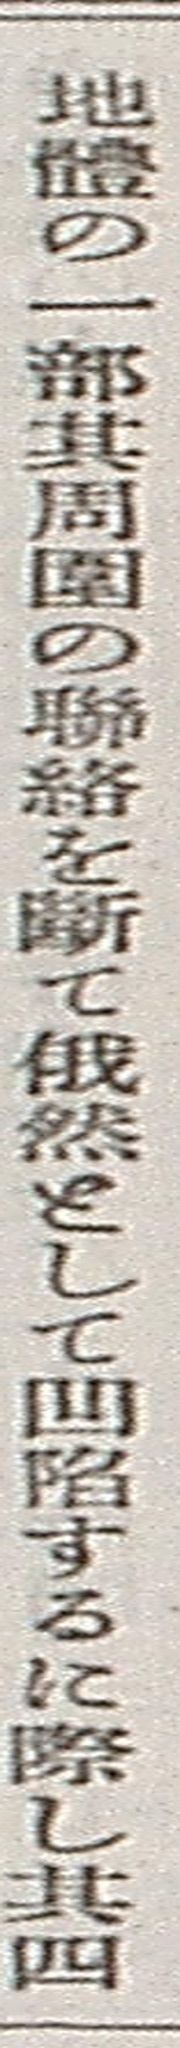地体の一部其周囲の連絡を断て俄然として凹陥するに際し其四
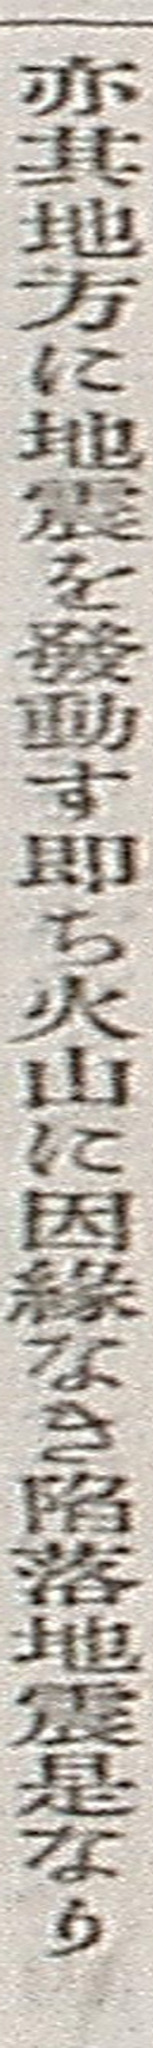亦其地方に地震を発動す即ち火山に因縁なき陥落地震是なり
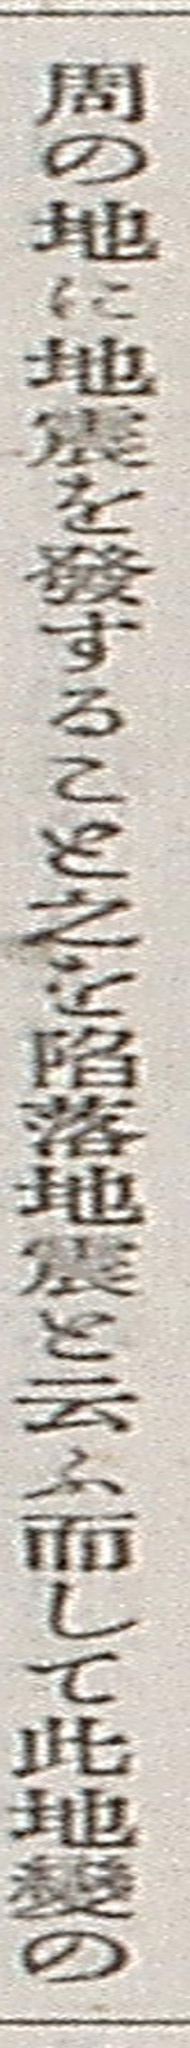周の地に地震を発すること之を陥落地震と云ふ而して此地変の
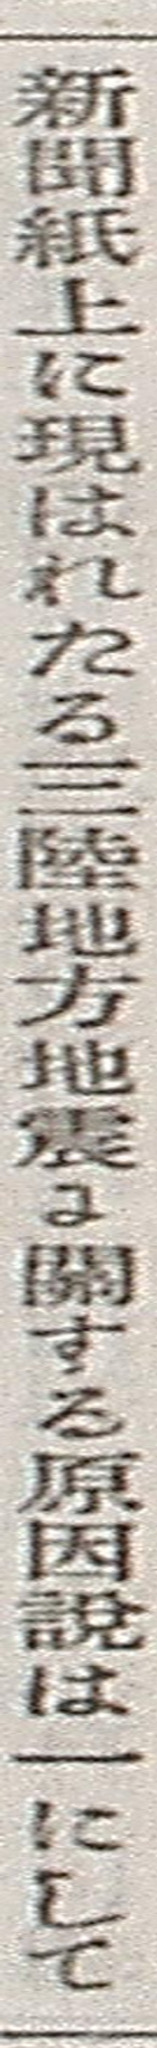新聞紙上に現はれたる三陸地方地震に関する原因説は一にして
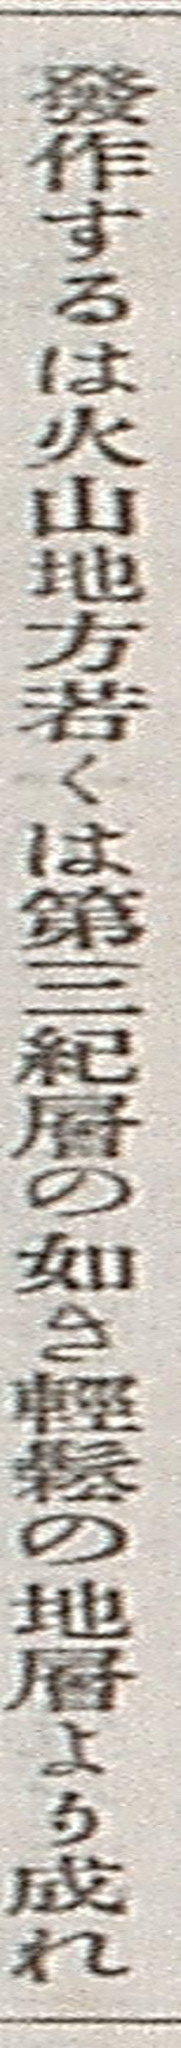発作するは火山地方若くは第三紀層の如き軽鬆の地層より成れ
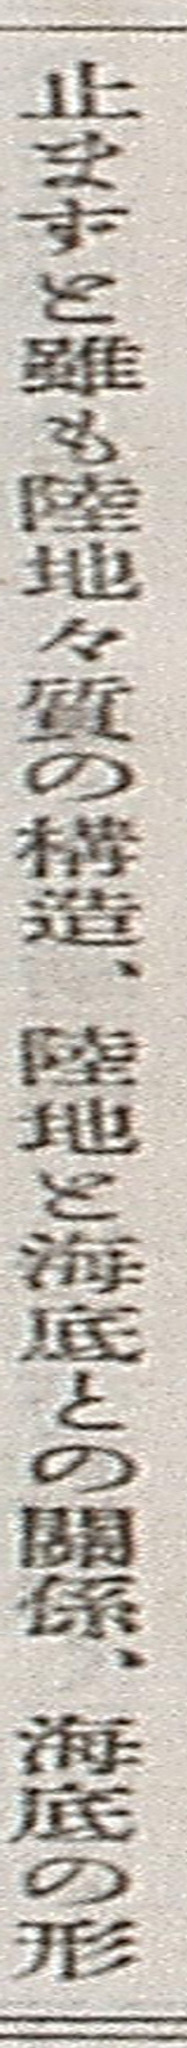止まずと雖も陸地々質の構造、陸地と海底との関係、海底の形
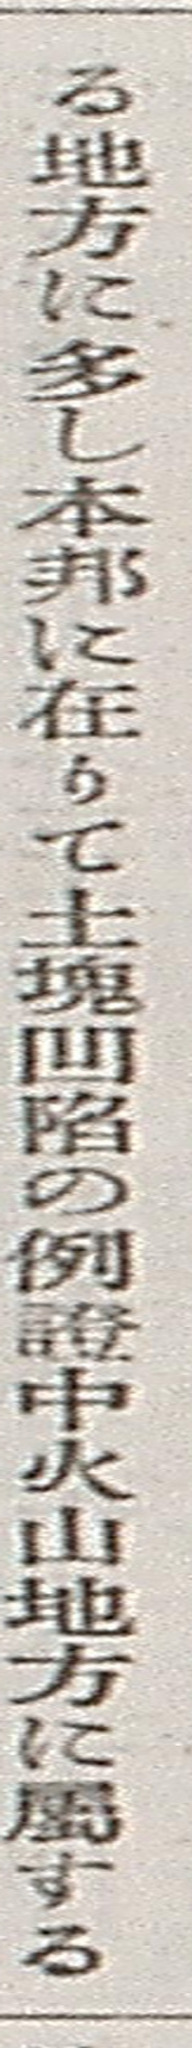る地方に多し本邦に在りて土塊凹陥の例証中火山地方に属する
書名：風俗畫報臨時増刊第百二十號　大海嘯被害録（下）
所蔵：東京大学地震研究所図書室 Earthquake Research Institute Library, The University of Tokyo, JAPAN
